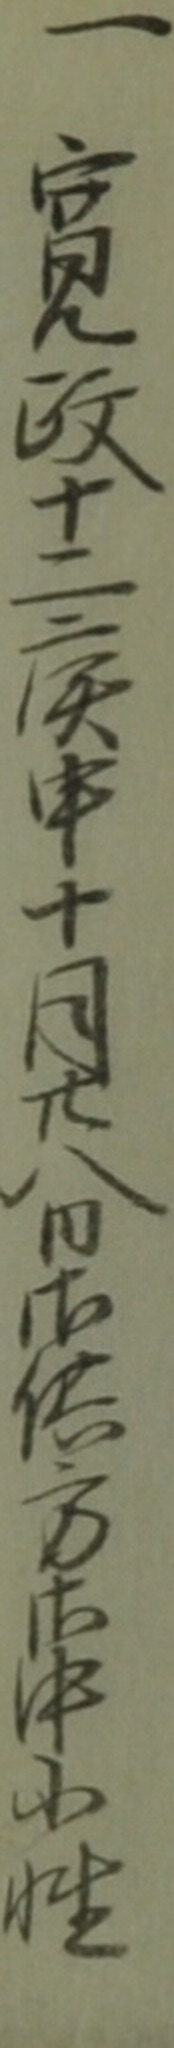一寛政十二庚申十月廿八日御供方御中小性
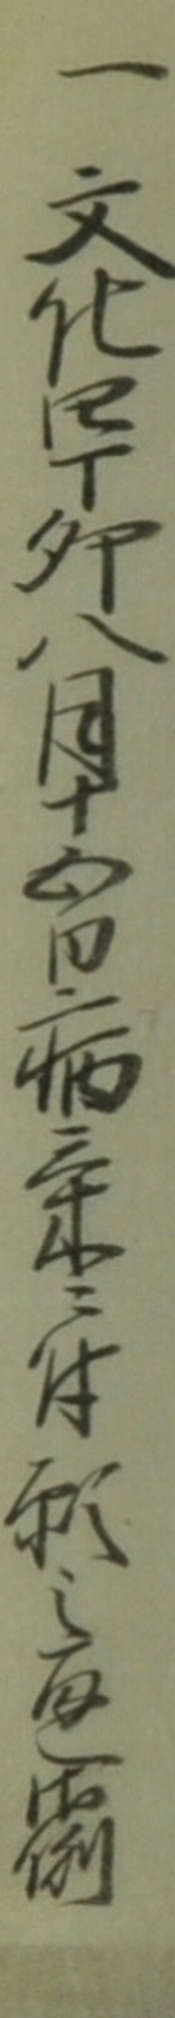一文化四丁卯八月十五日病気ニ付願之通御側
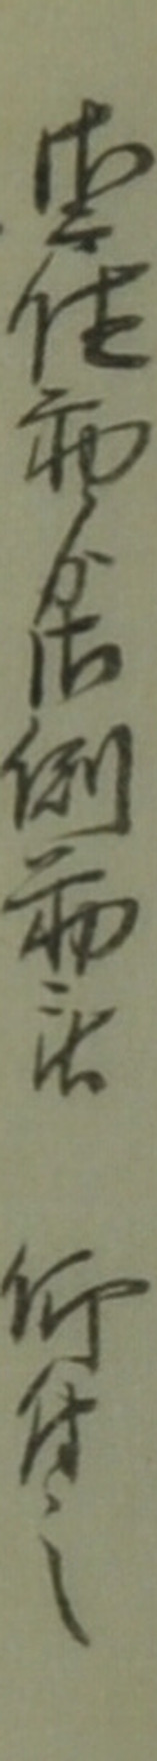御雇勤ゟ御側勤被仰付之

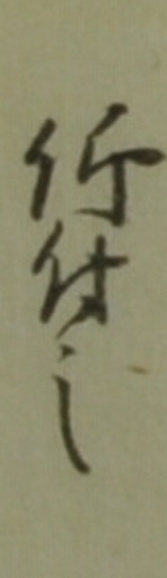仰付之
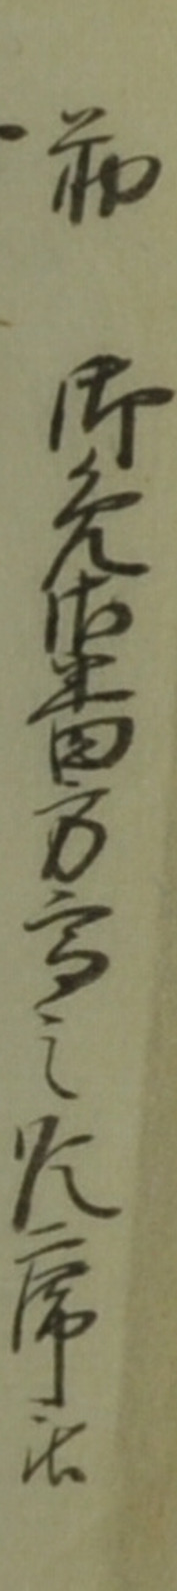勤御免御番方高之順席被
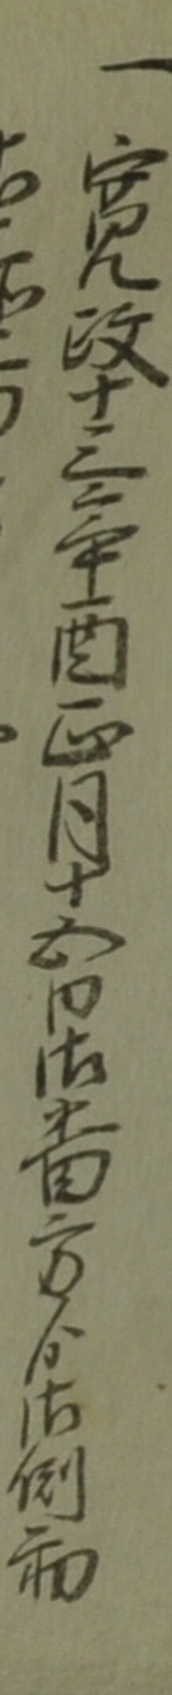一寛政十三辛酉正月十五日御番方ゟ御側勤
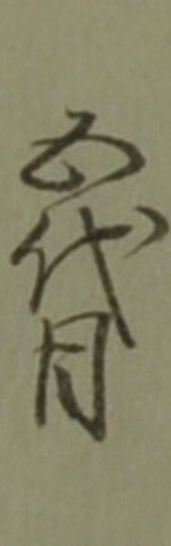五代目
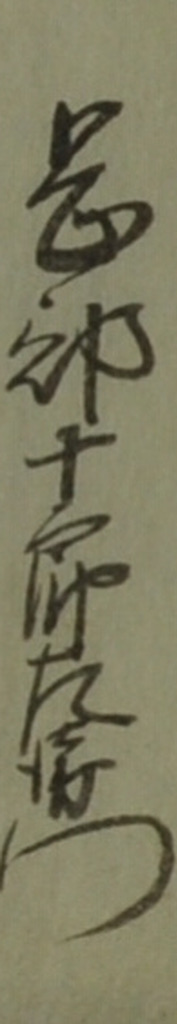岡部十郎左衛門
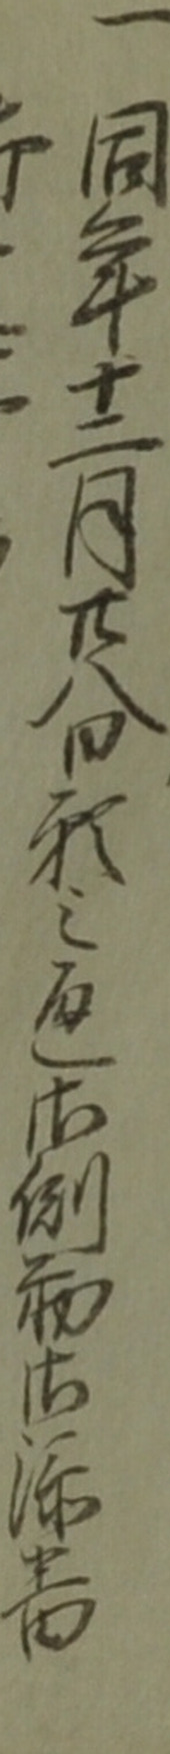一同年十二月廿八日願之通御側勤御添番
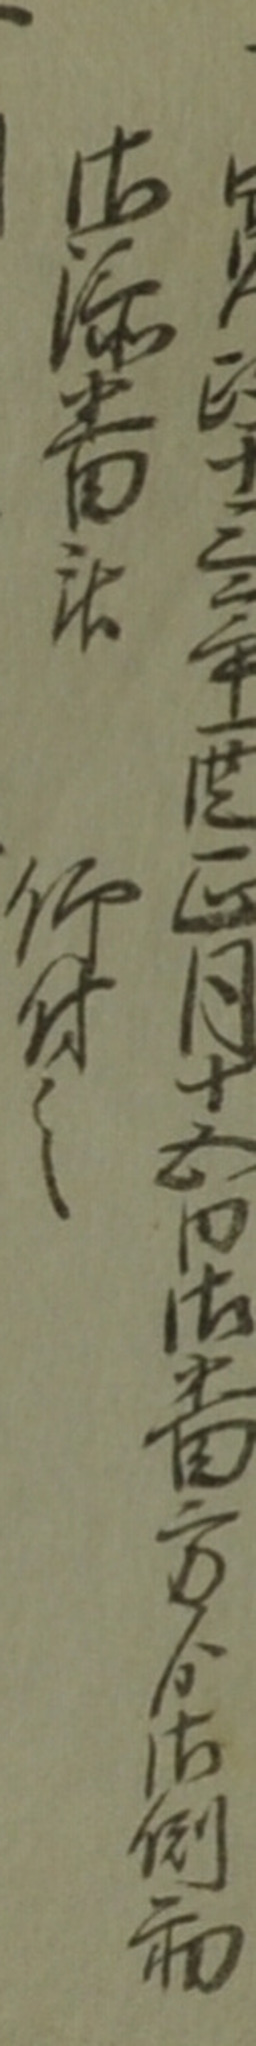御免帰番被仰付之
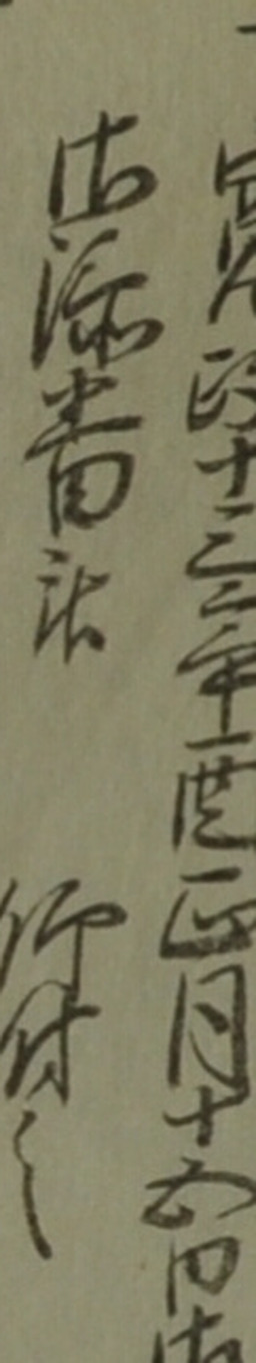御免帰番被仰付之
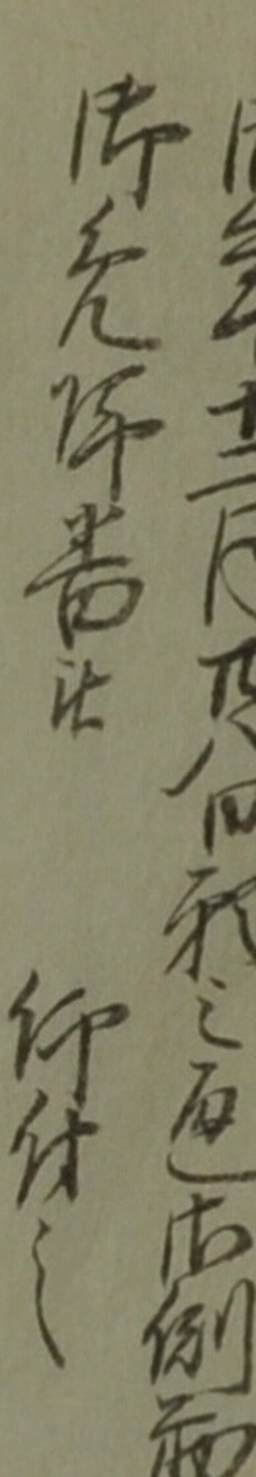御免帰番被仰付之
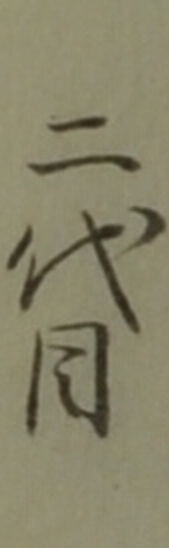二代目
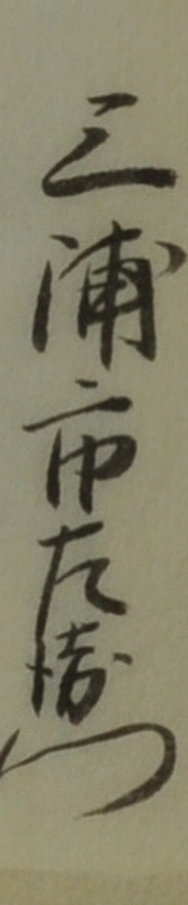三浦一市左衛門
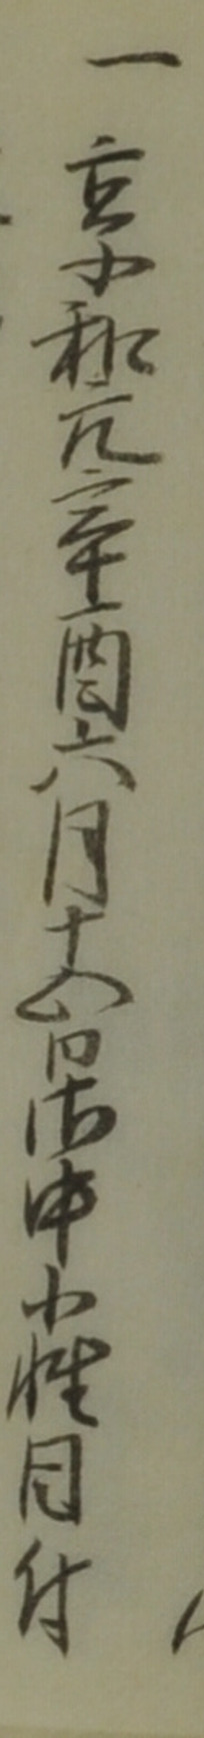一享和元辛酉六月十五日御中小性目付
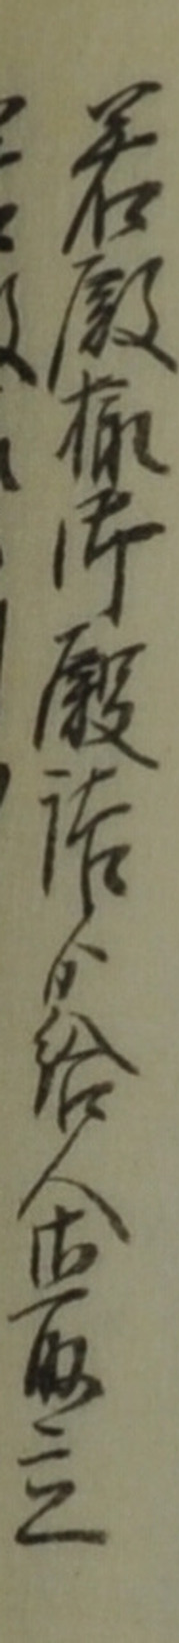若殿様御殿詰ゟ給人御取立
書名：諸御役代々録（五）
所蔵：伊那市立高遠町図書館・合同会社AMANE
